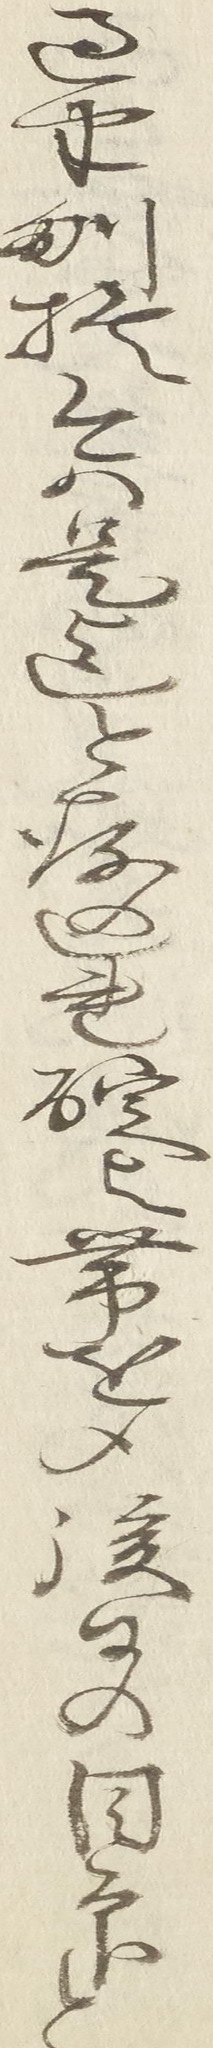過半刎捨今は是迄と存込れ碇と帯を〆後日の目印と
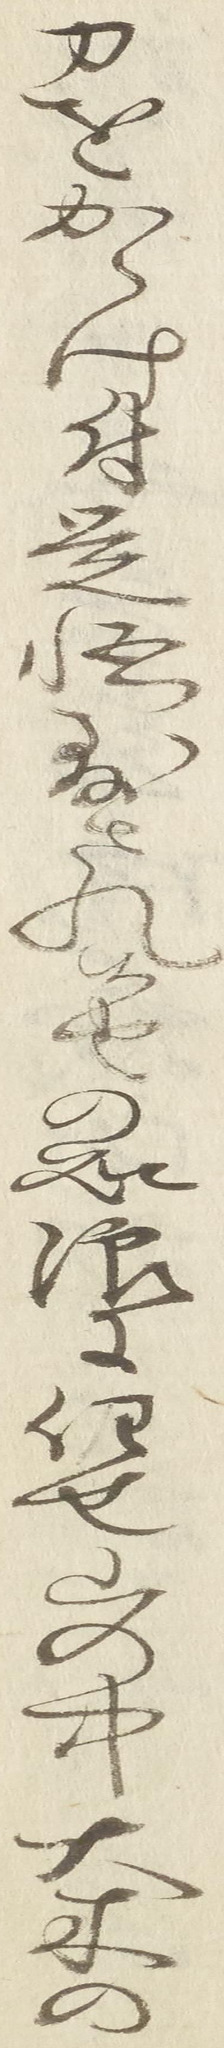刀をからけ付覚悟致され候由の処浪に任せ山の中大木の
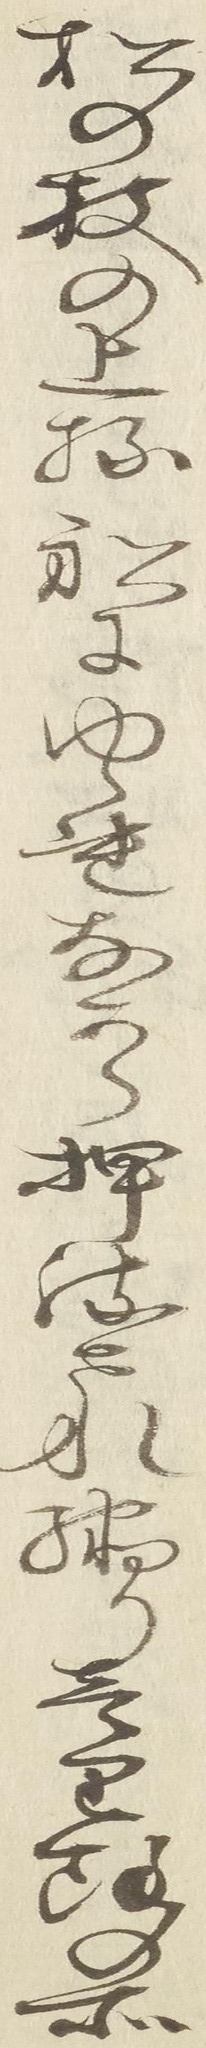松の枝の上抔船にゆられなから押流され縮り壱里餘の所

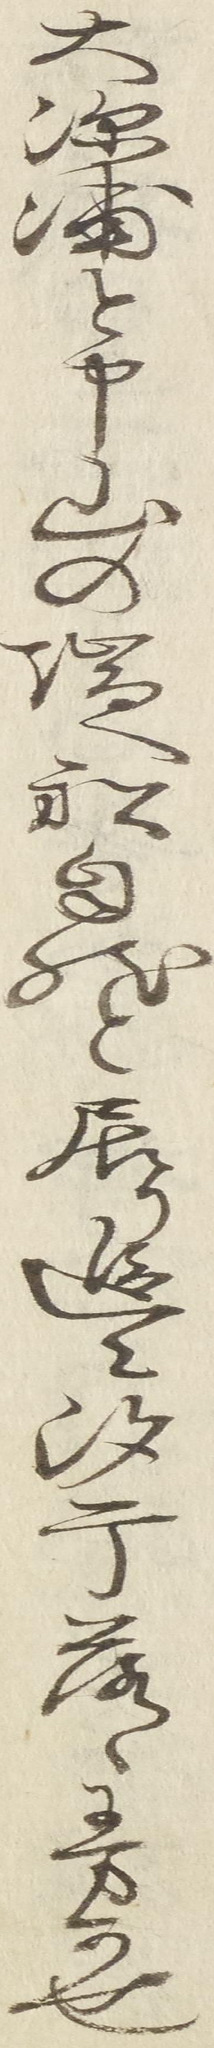大津浦と申山の端へ船自然と居り追々汐干落候にまかせ
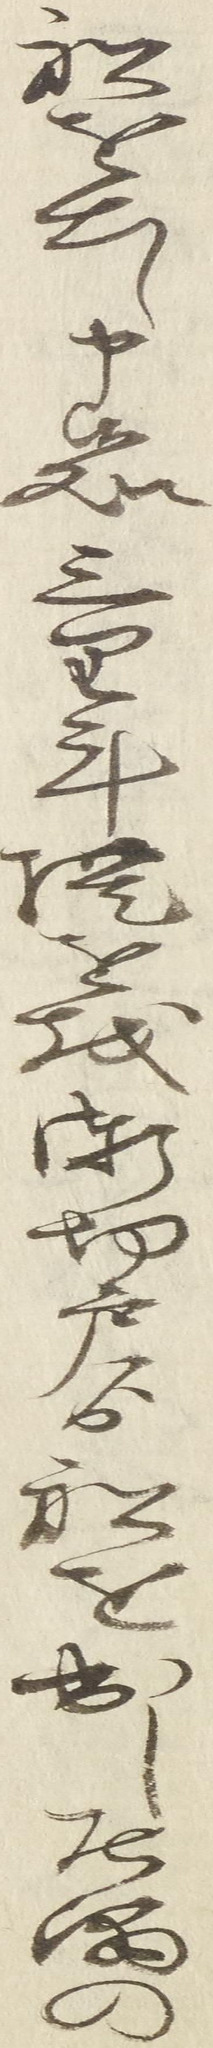船を出し申候処三里斗堤を越御切戸ゟ船を出し居偶の
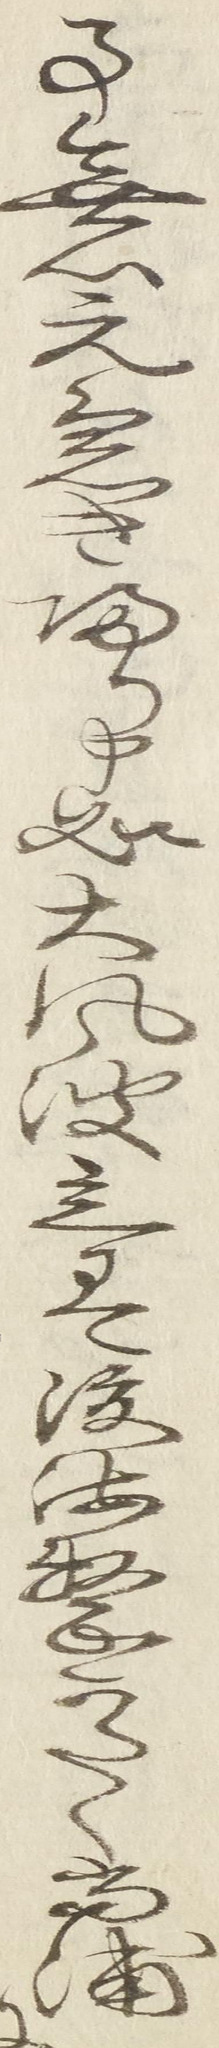事無心元急き帰り申処大風波立にて渡海整かたく当浦に
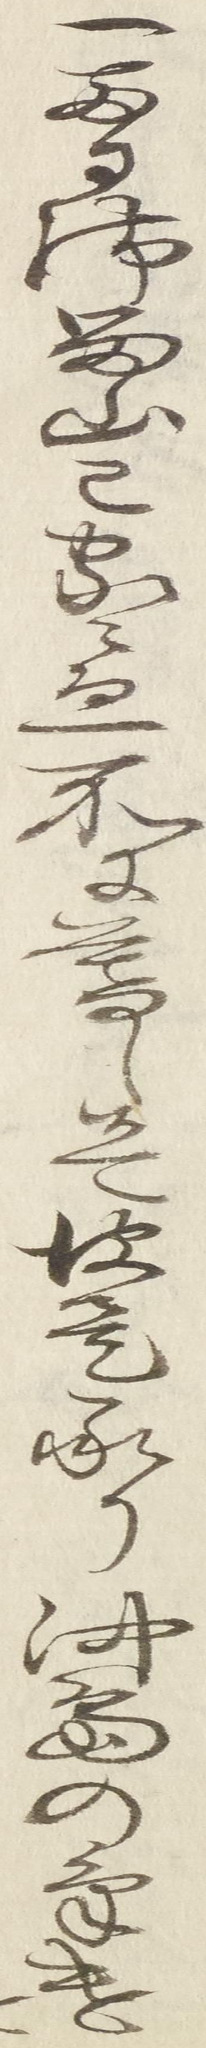一両日滞留山已家二而一所に暮し候て彼是承り沖島の気遣と
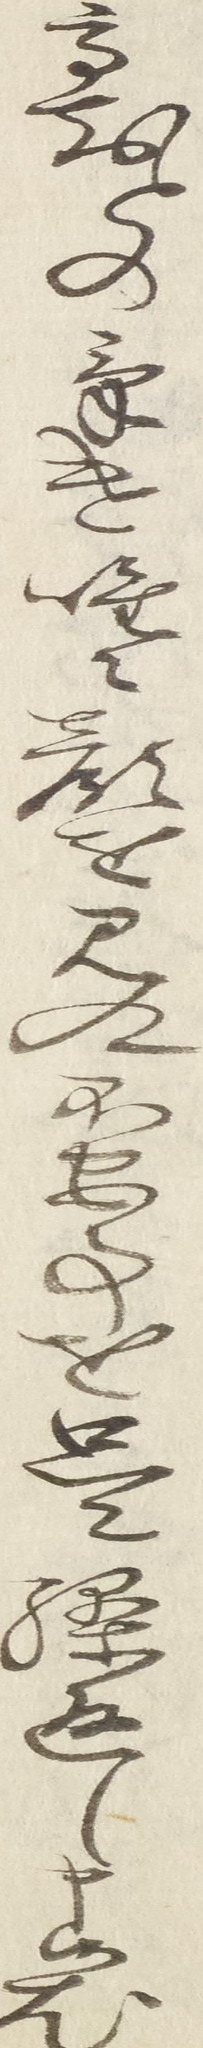高知との気遣唯々顔を見合不安事を只々繰返し申候尤
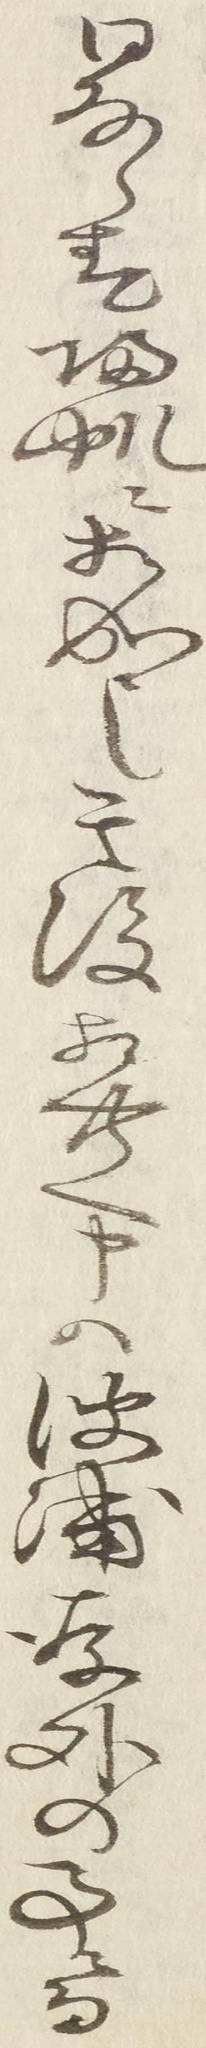日ならす帰帆に相成申候其後相聞へ申は波浦存外の事二而
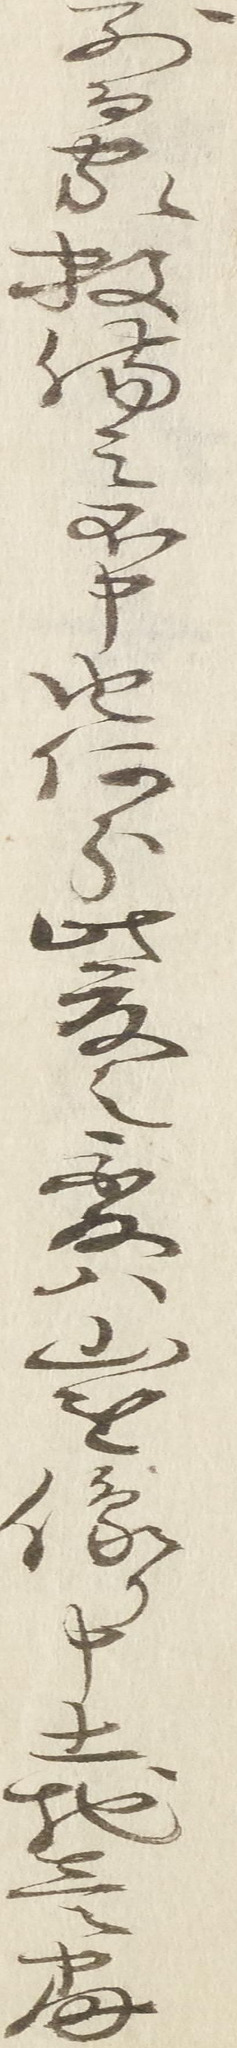別而家数傷み不申由何分此度之震は山を像り申土地壱番
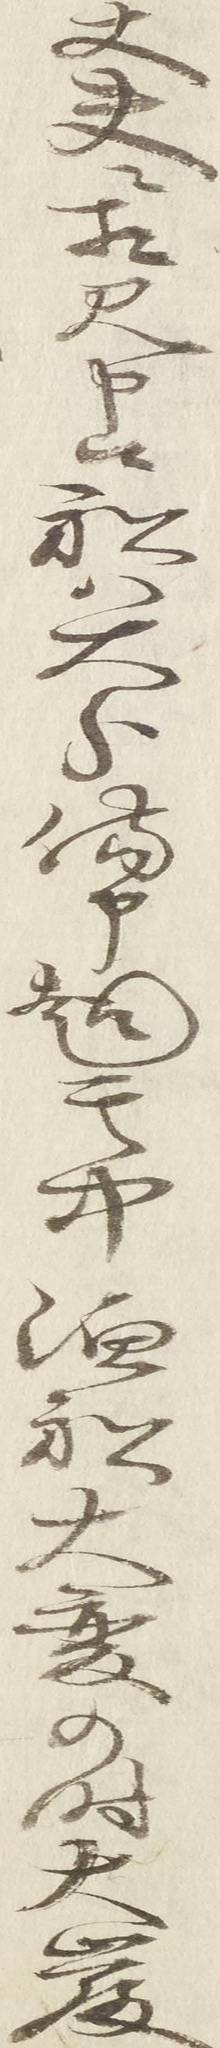丈夫二相見申候船は大分傷申趣其中泊船大変の時大巌
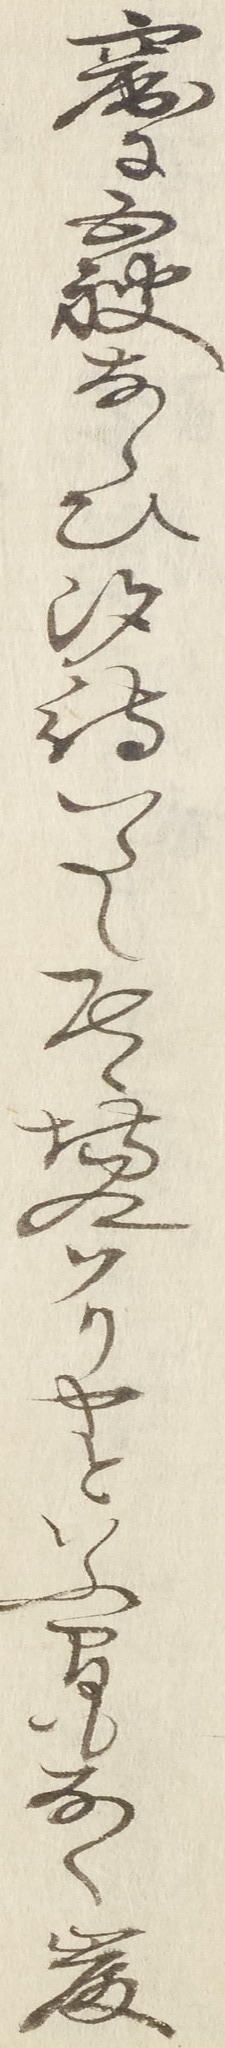窟に五艘ならひ汐待いたし居候場合ソリヤといふ間もなく巌
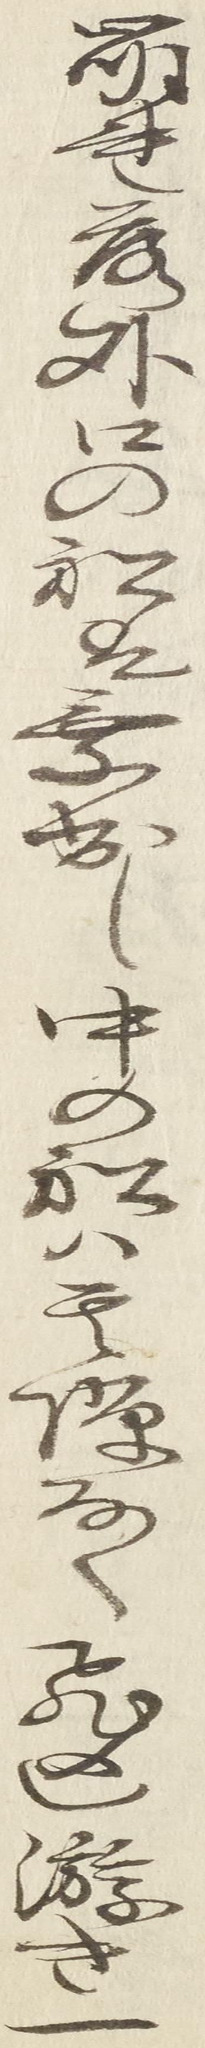崩れ落外口の船は乗出し中の船は其隙なく飛込游き一
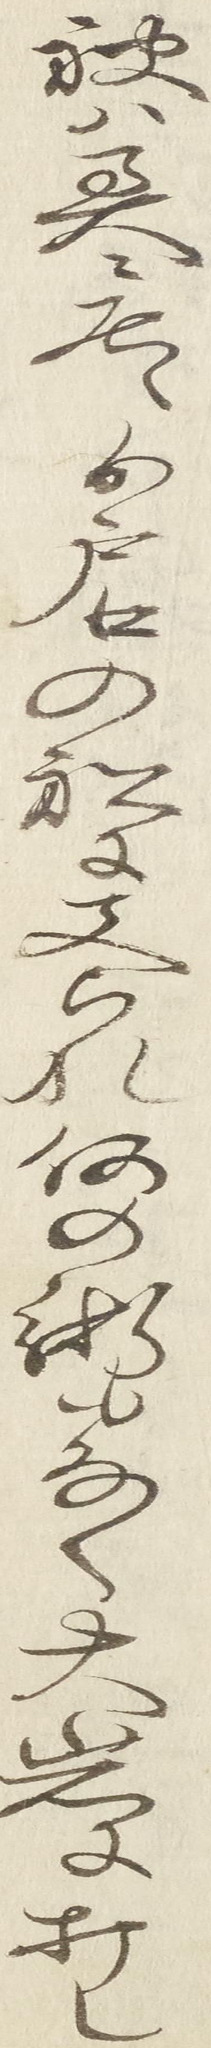艘は奥に居候ゟ戸口の船に支られ何の術もなく大岩に打れ
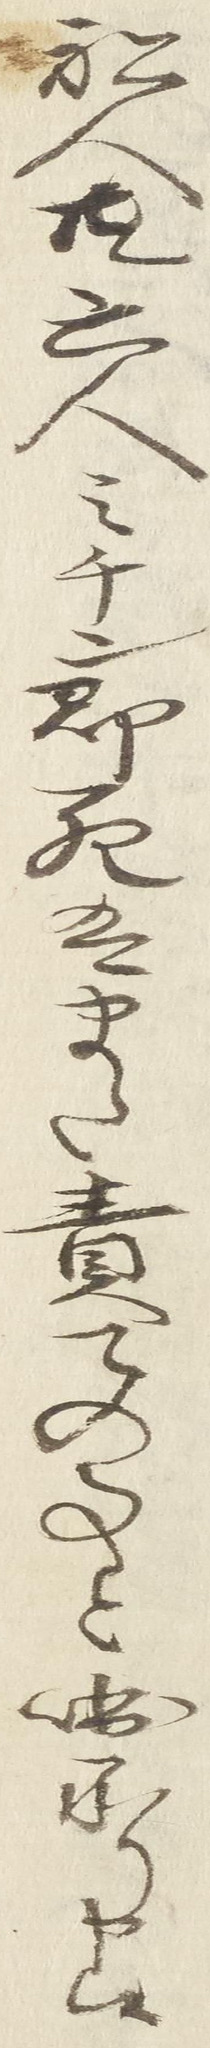船人共六人ミチン即死有また責ての事と咄承り申候
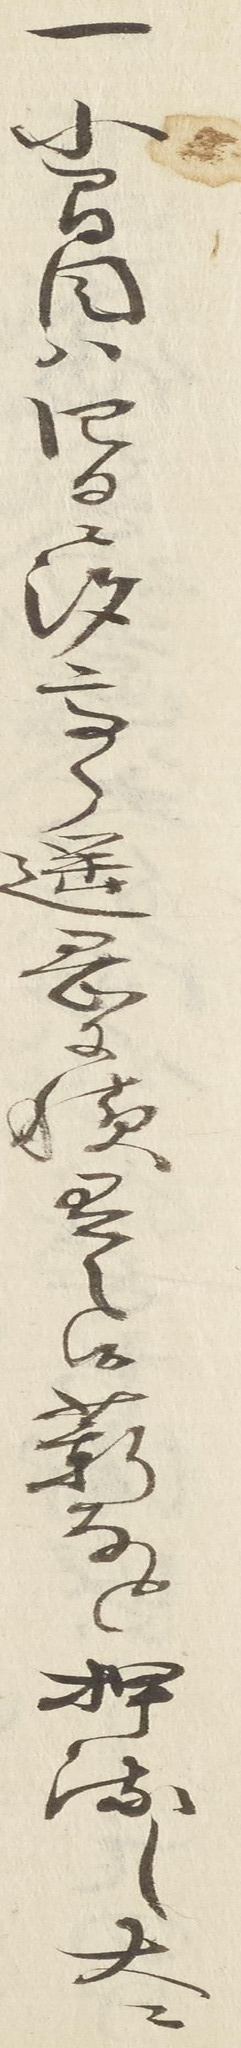一小間目は四日に汐高く遥岡に積有之候薪など押流し大に
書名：地震記　下
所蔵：東京大学地震研究所図書室 Earthquake Research Institute Library, The University of Tokyo, JAPAN
